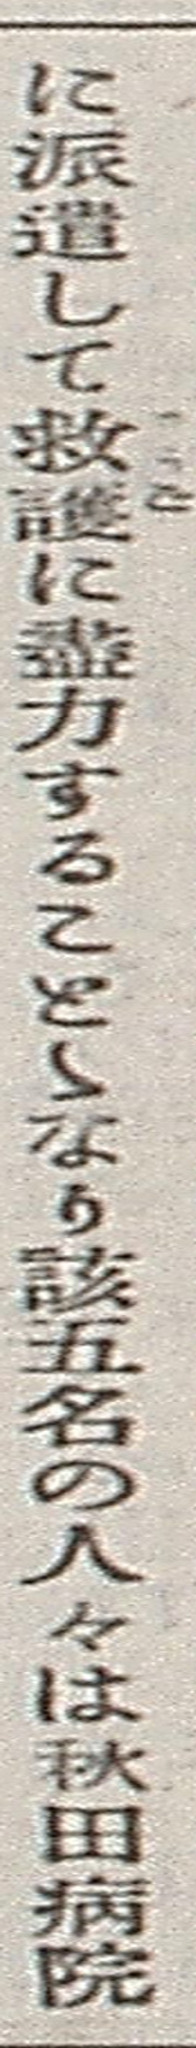に派遣して救護に尽力することゝなり該五名の人々は秋田病院
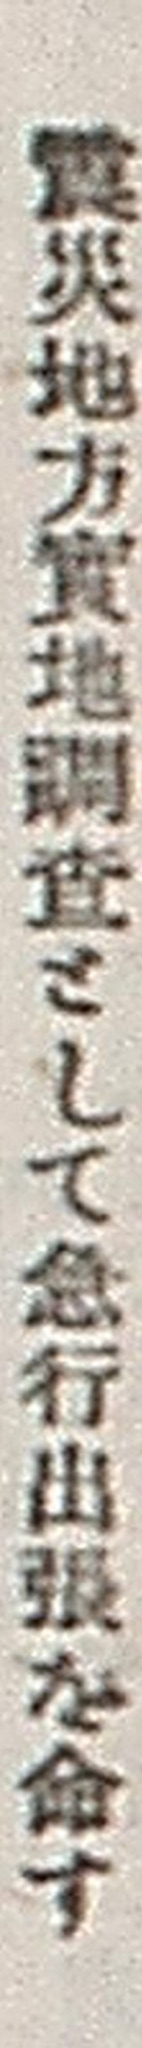震災地方実地調査として急行出張を命す
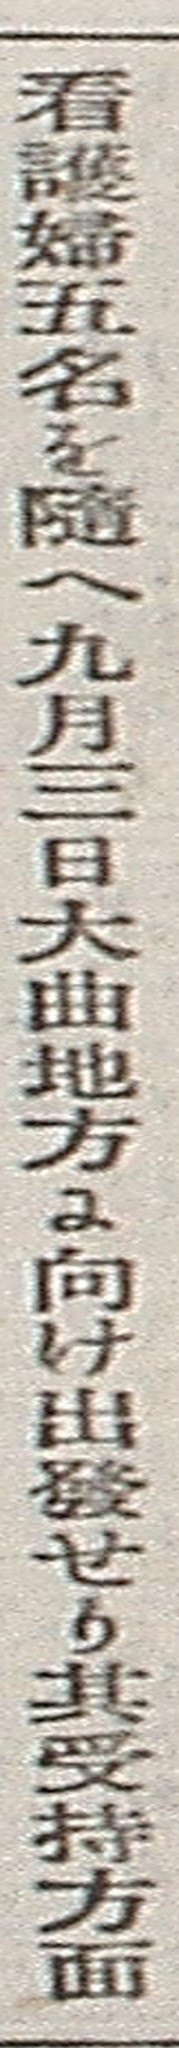看護婦五名を随へ九月三日大曲地方に向け出発せり其受持方面
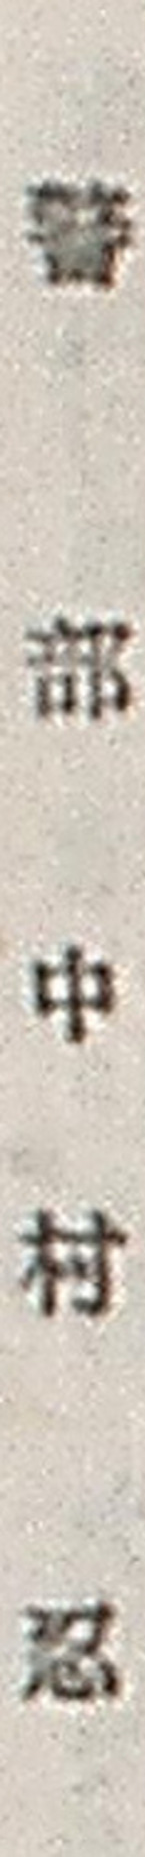警部中村忍
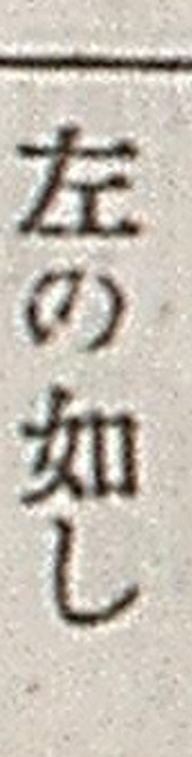左の如し

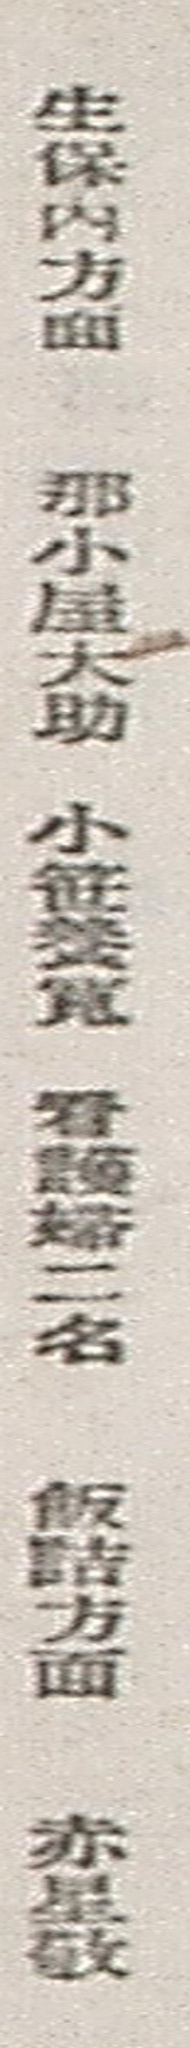生保内方面那小屋大助小笹養箟看護婦二名飯詰方面赤星敬
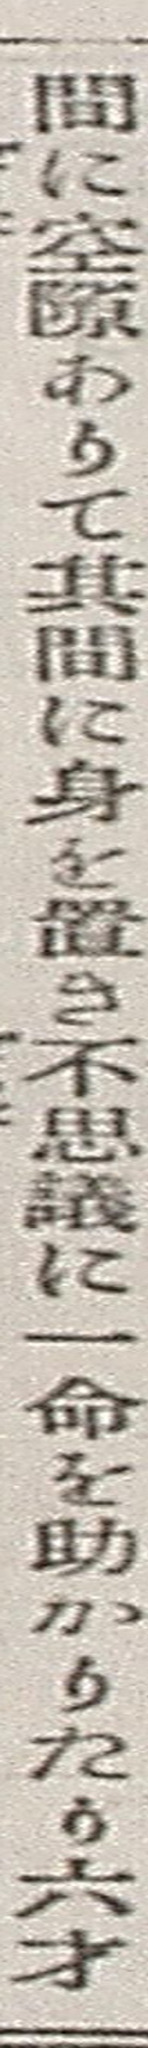間に空隙あり其間に身を置き不思議に一命を助かりたり六才
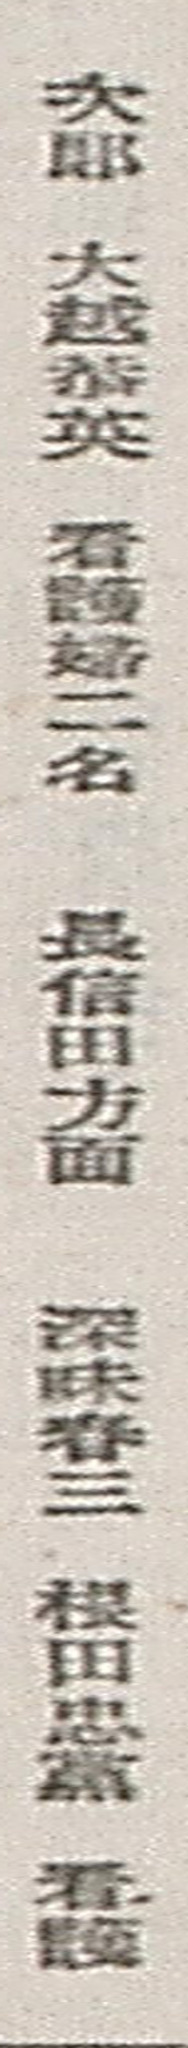次郎大越恭英看護婦二名長信田方面深味春三根田忠薫看護
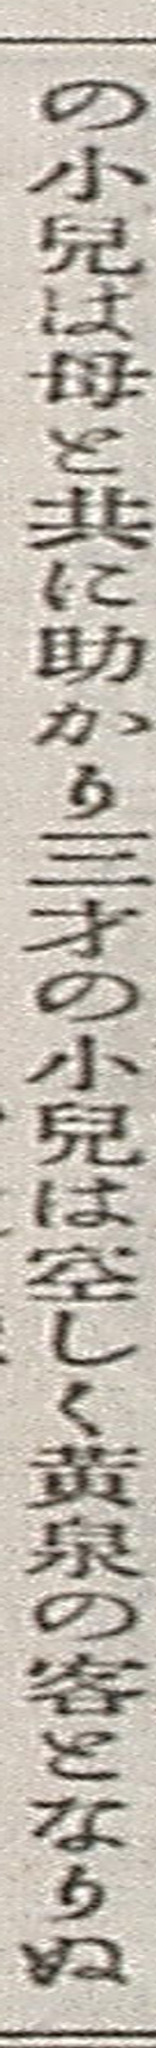の小児は母と共に助かり三才の小児は空しく黄泉の客となりぬ
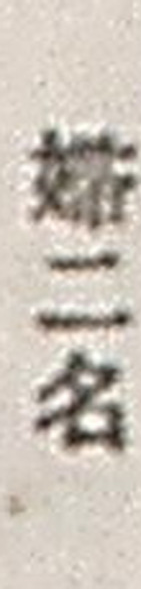婦二名
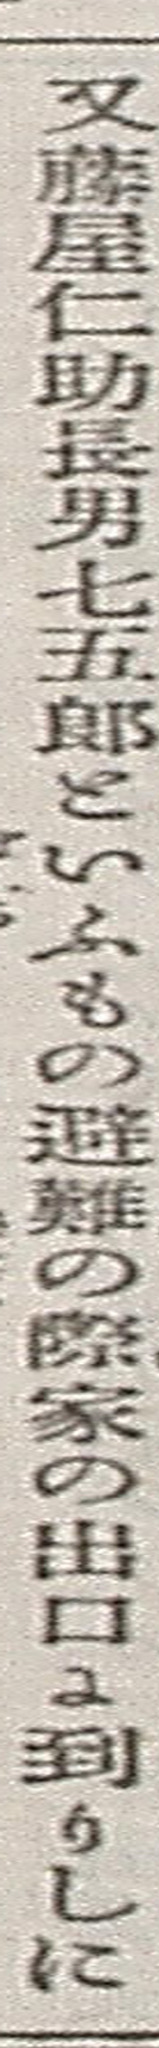又藤屋仁助長男七五郎といふもの避難の際家の出口に到りしに
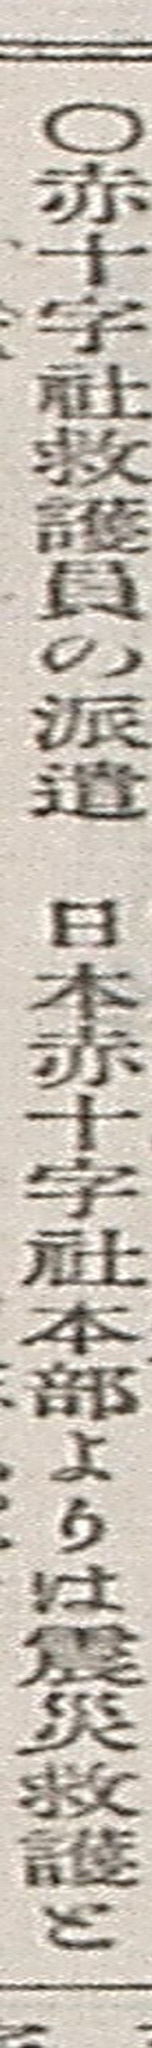〇赤十字社救護員の派遣日本赤十字社本部よりは震災救護と
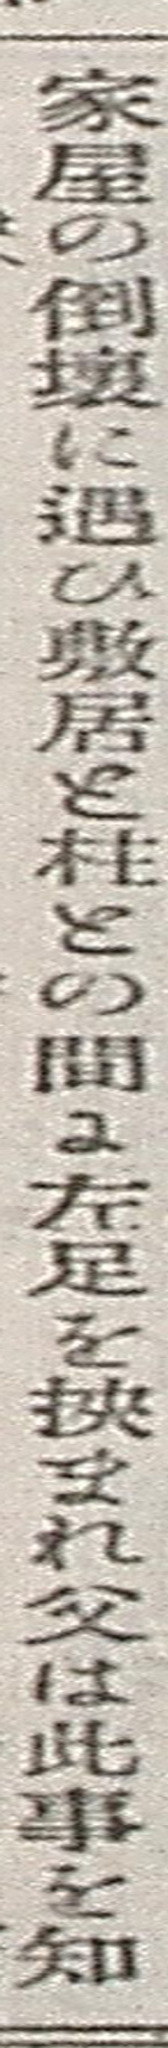家屋の倒壊に遭ひ敷居と柱との間に左足を挟まれ父は此事を知
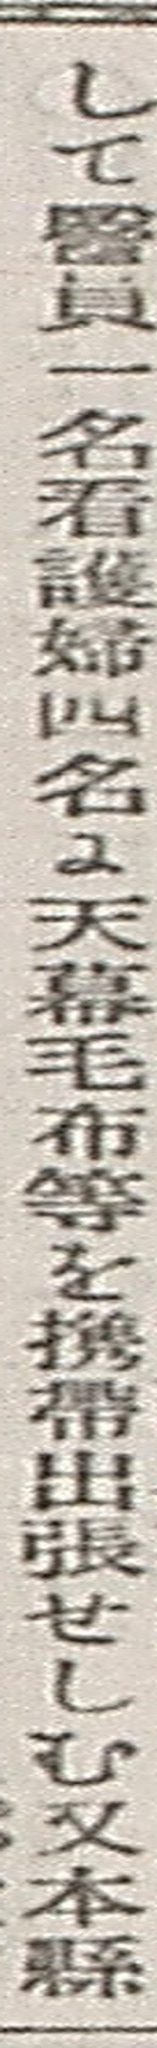して医員一名看護婦四名に天幕毛布等を携帯出張せしむ又本県
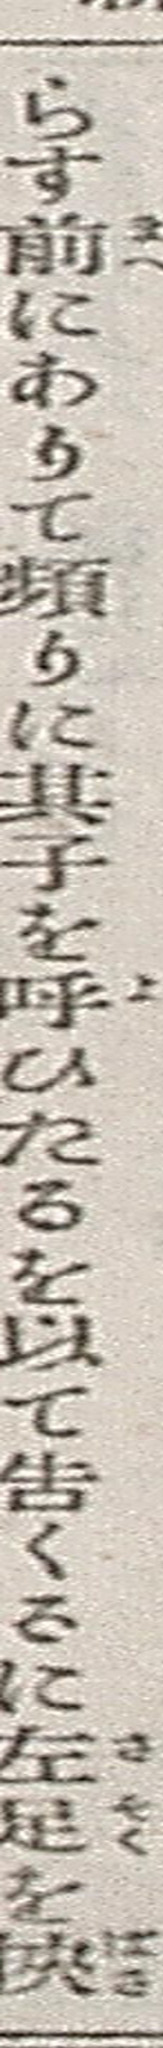らす前にありて頻りに其子を呼ひたるを以て告くるに左足を挟
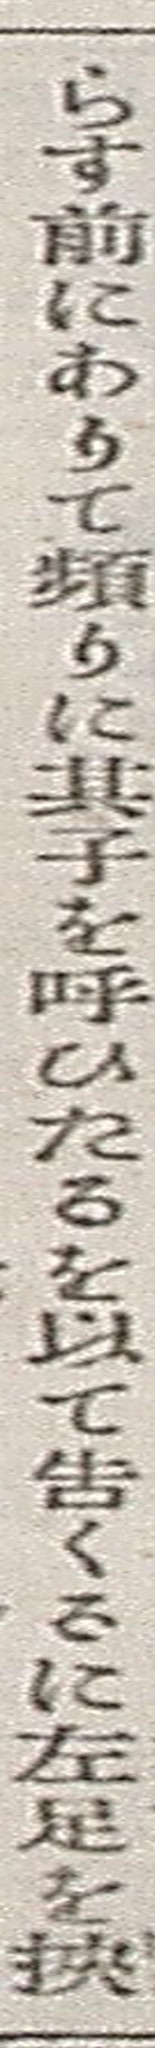らす前にありて頻りに其子を呼ひたるを以て告くるに左足を挟
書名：風俗畫報臨時増刊第百二十四號　洪水地震被害録（上）
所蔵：東京大学地震研究所図書室 Earthquake Research Institute Library, The University of Tokyo, JAPAN
